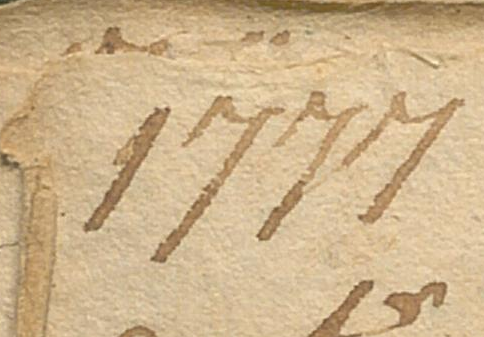1777
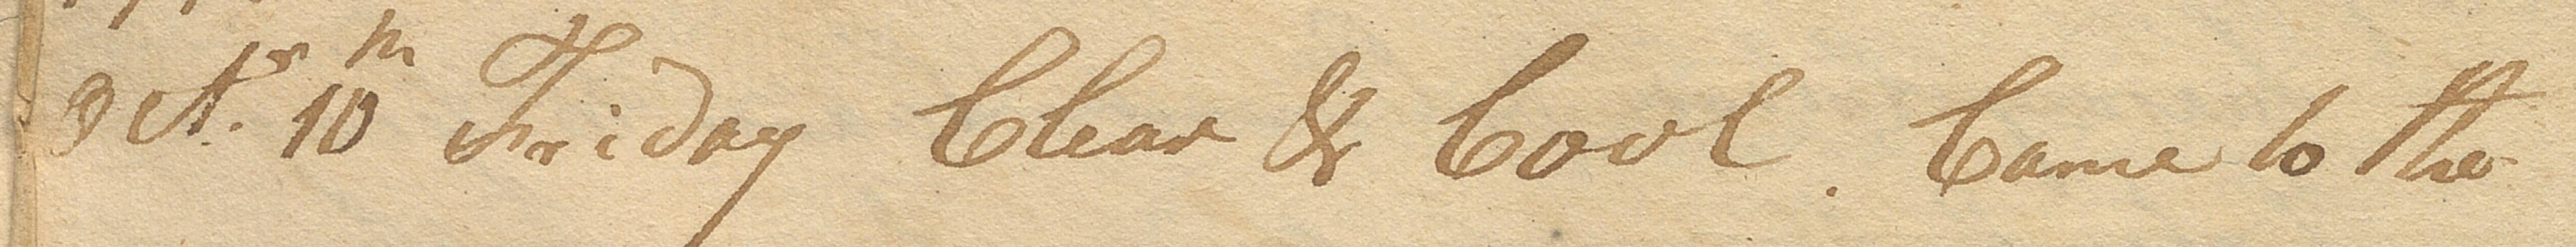Oct^r. 10^th Friday Clear & Cool Came to the
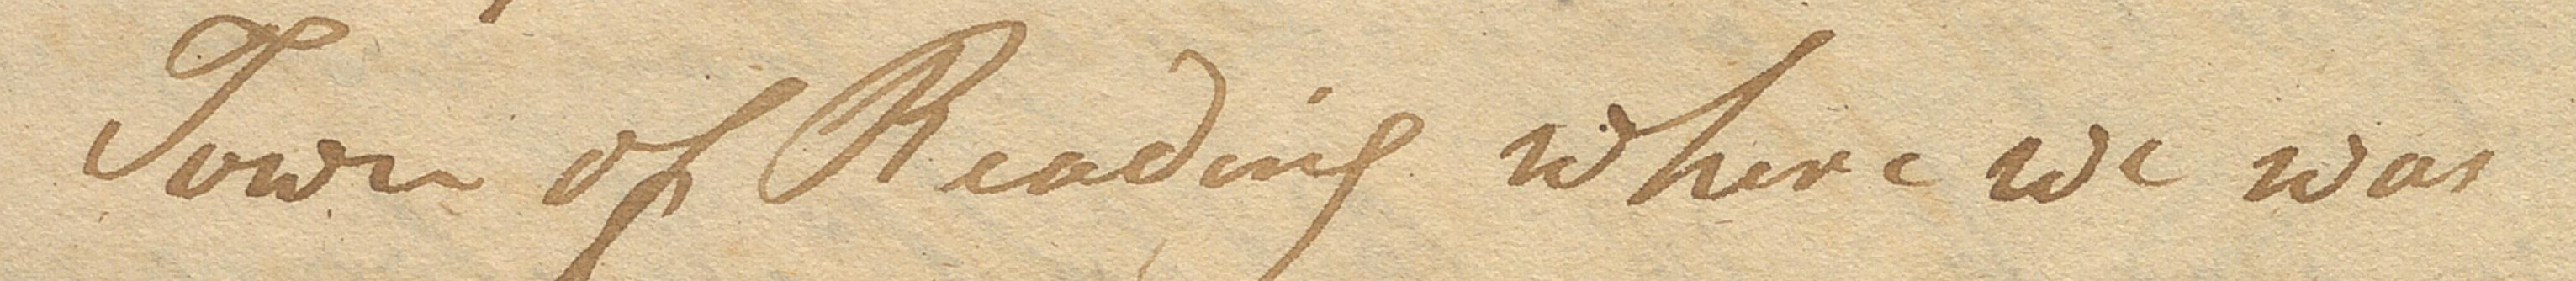Town of Reading where we was
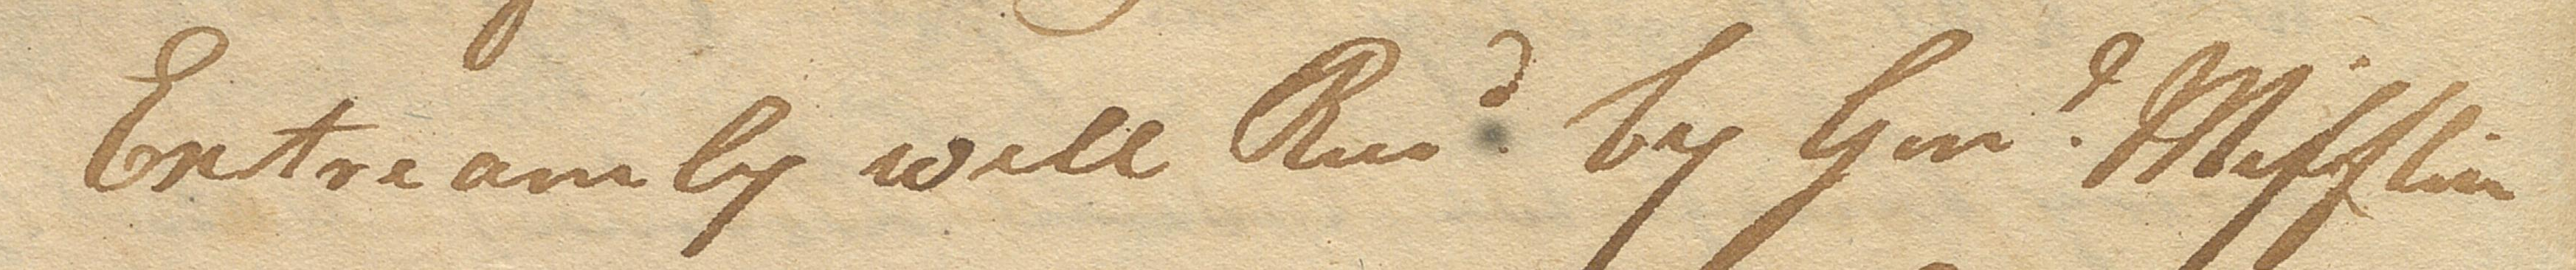Extreamly well Rec^d. by Gen^l. Mifflin
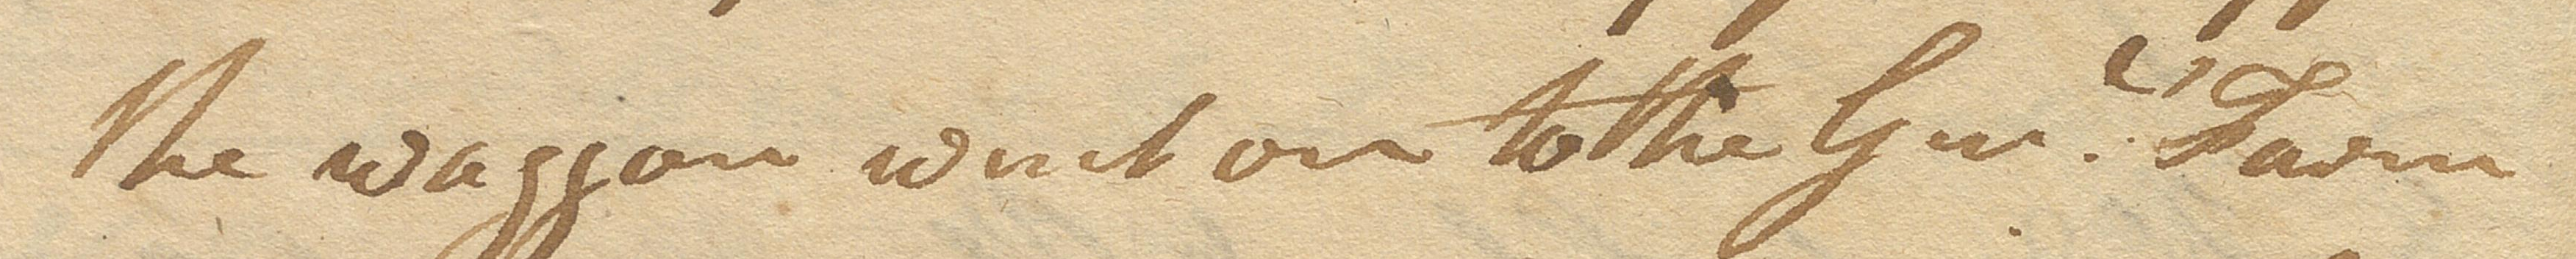the waggon went on to the Gen^l. Farm
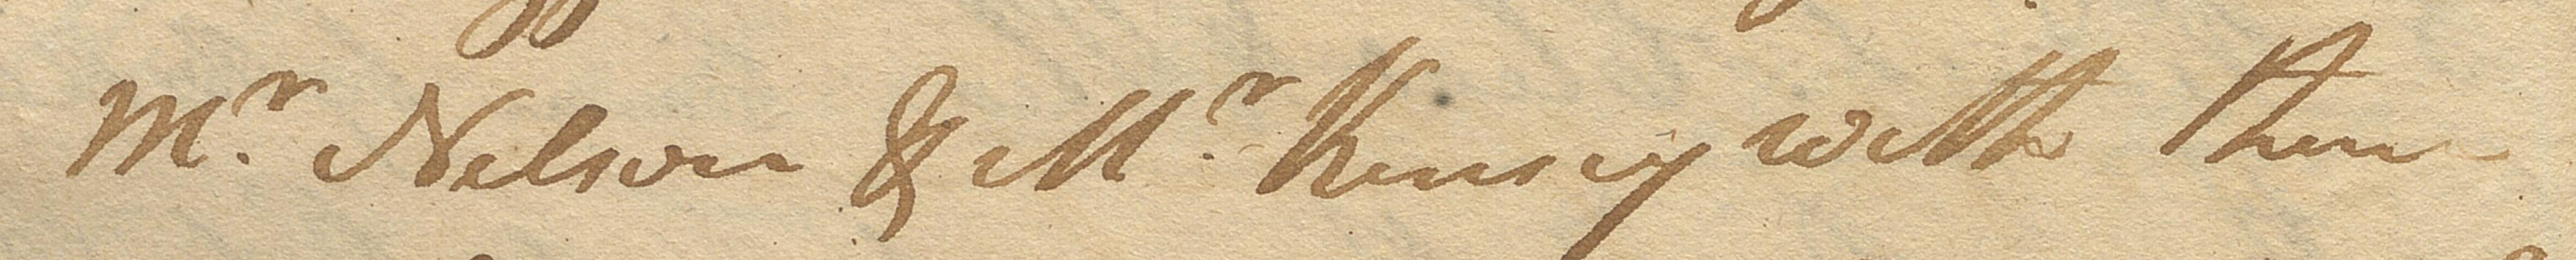M^r. Nelson & M^r. Kinsey with then
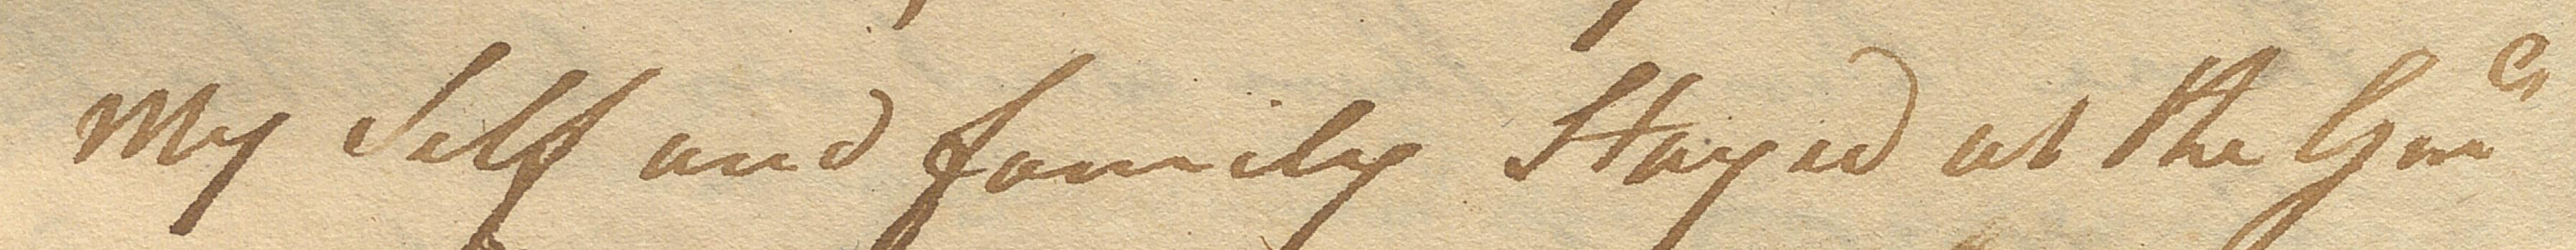My self and family Stayed at the Gen^l.
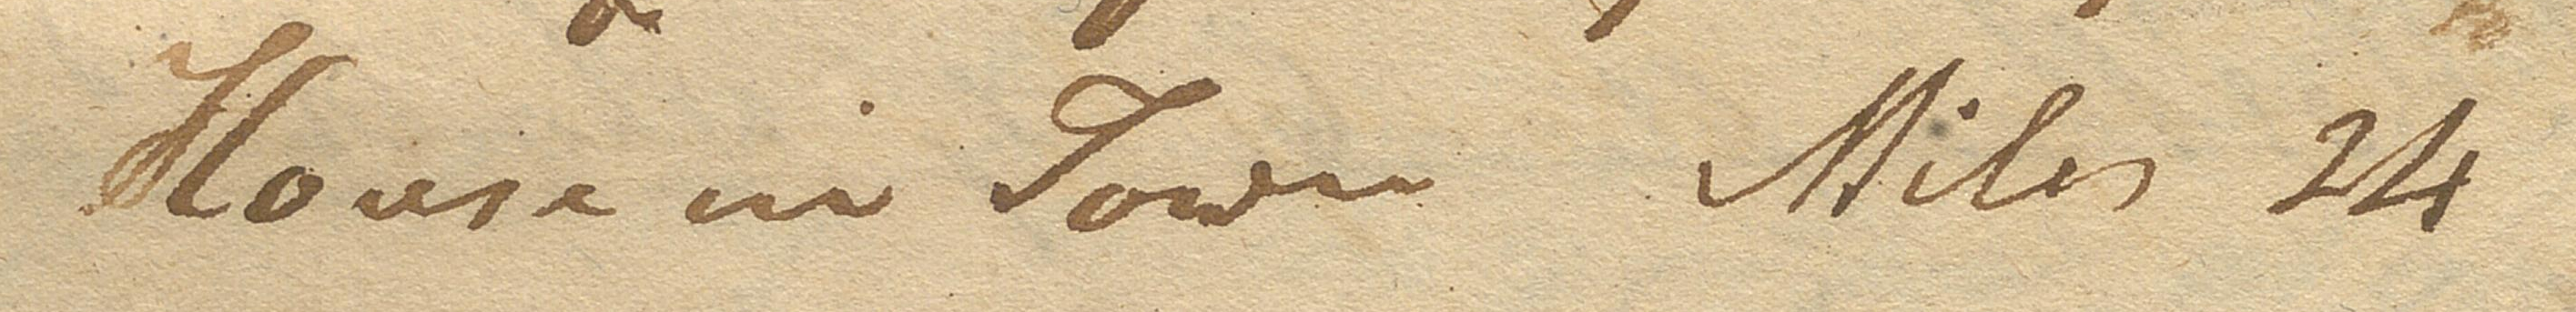House in Town Mile 24
